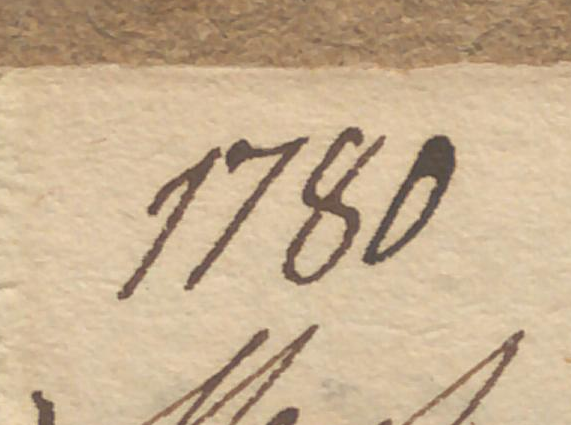1780
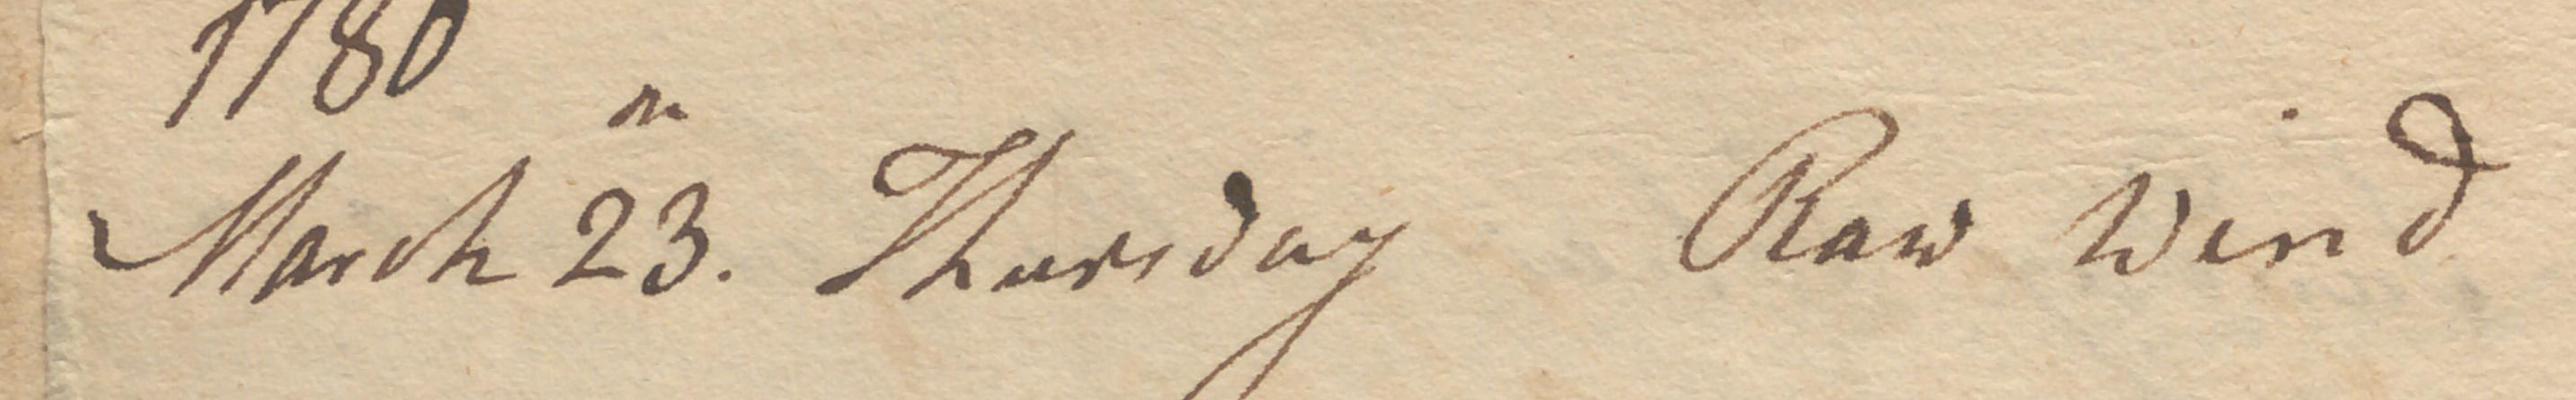March 23^th. Thursday Raw wind
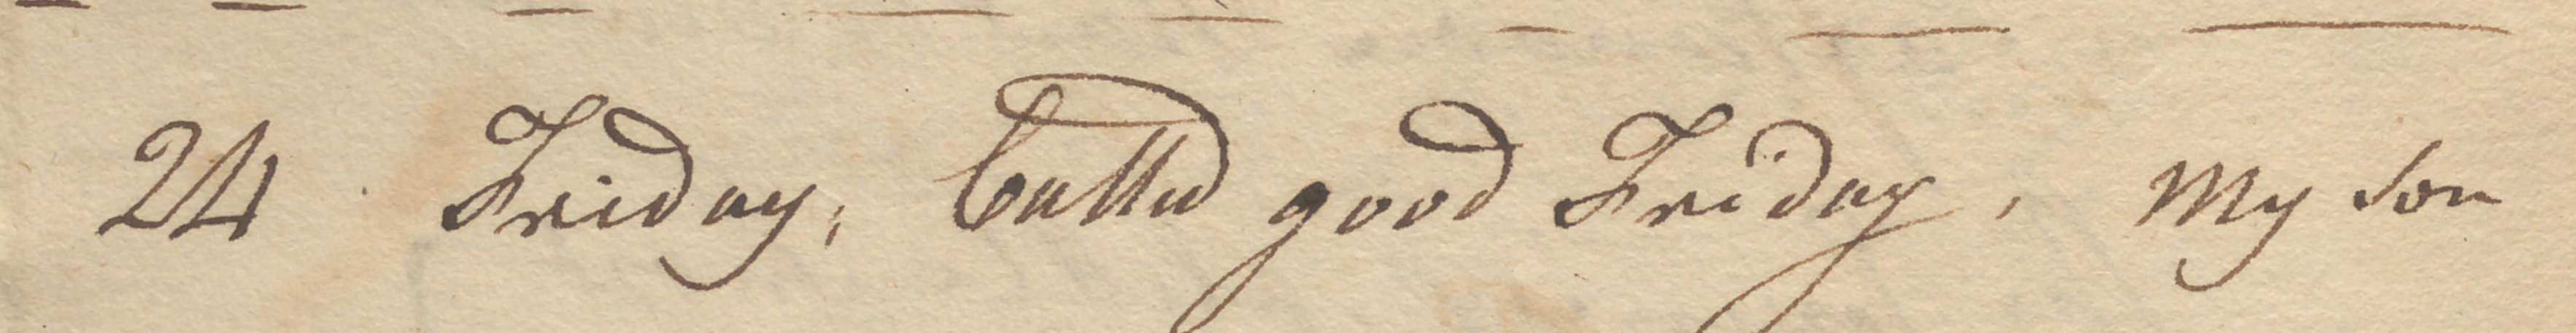24 Friday, Called good Friday, My son
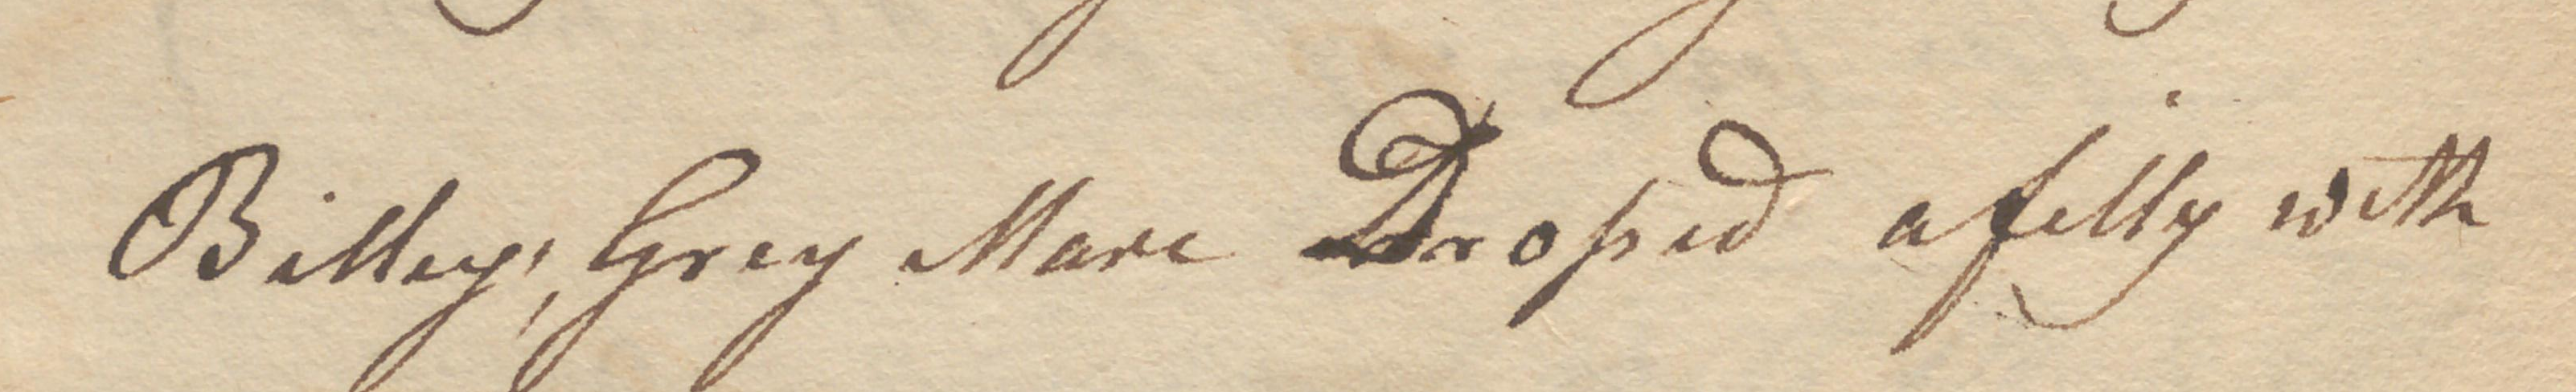Billey, Grey Mare Droped a filly with
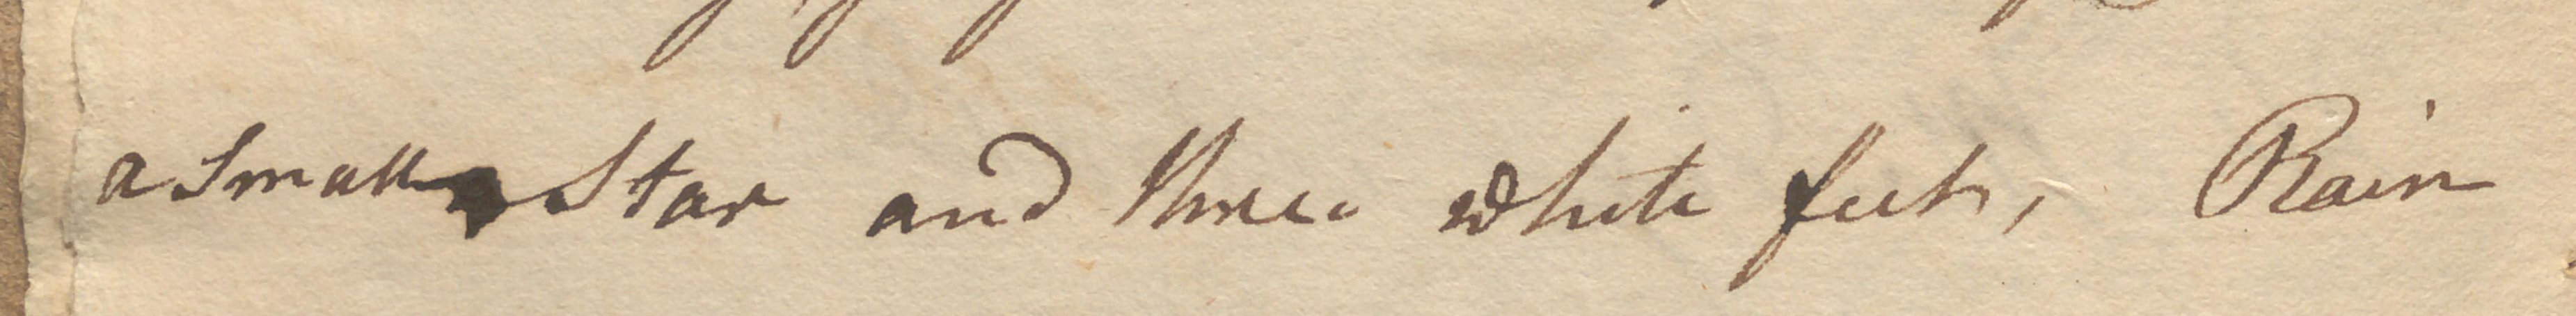a small Star and three white feet, Rain
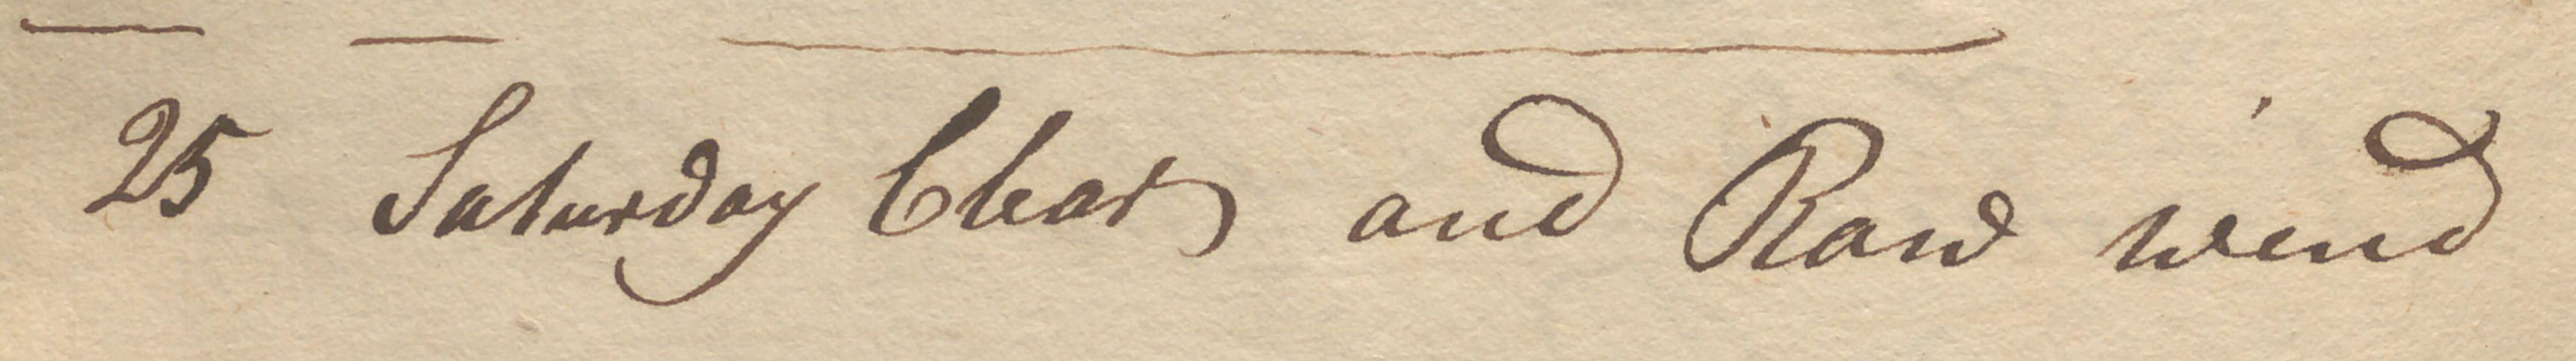25 Saturday Clear and Raw wind
